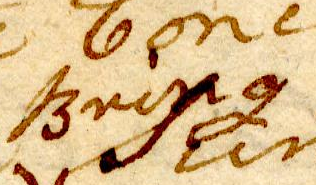Bring
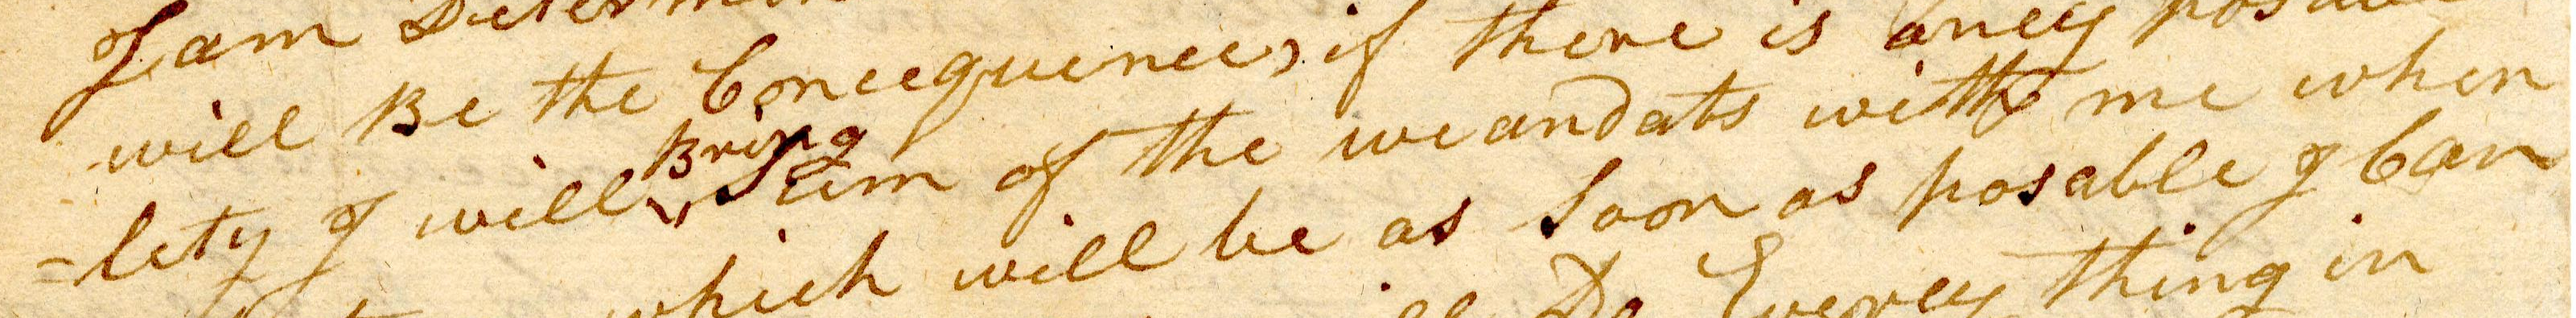-lety I will^ Sum of the weandats with me when
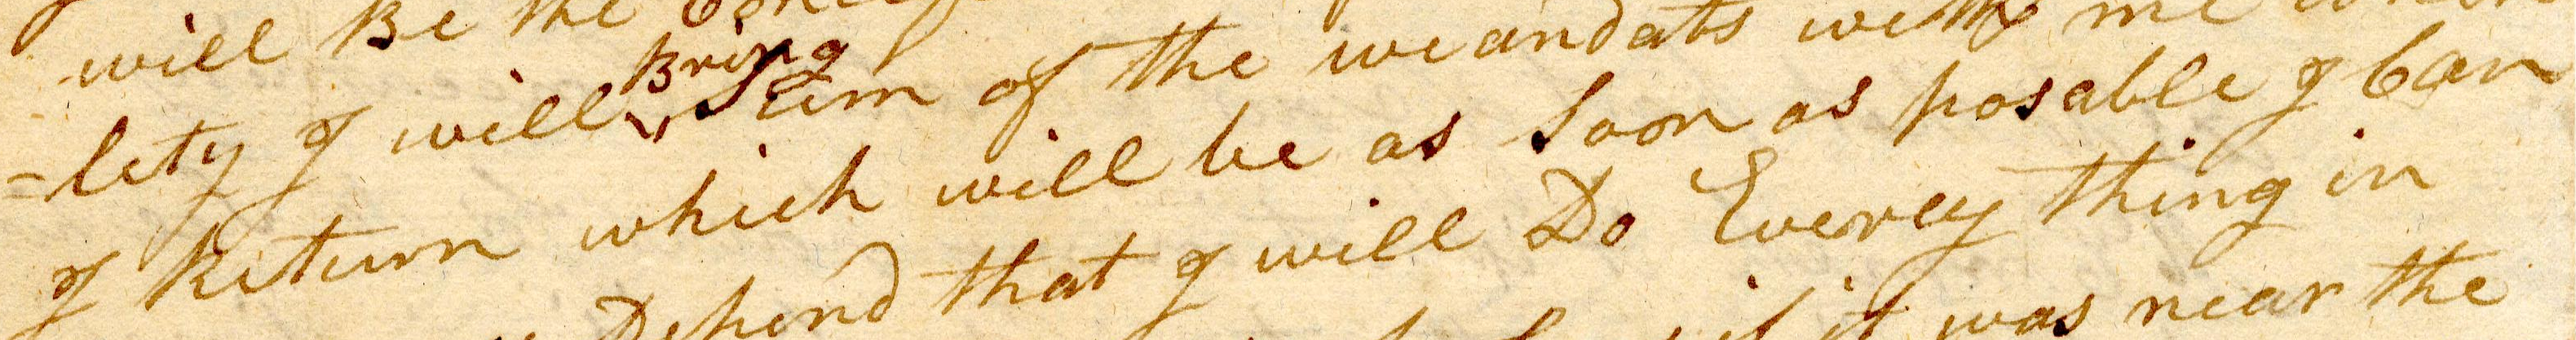I Return which will be as soon as posable I can
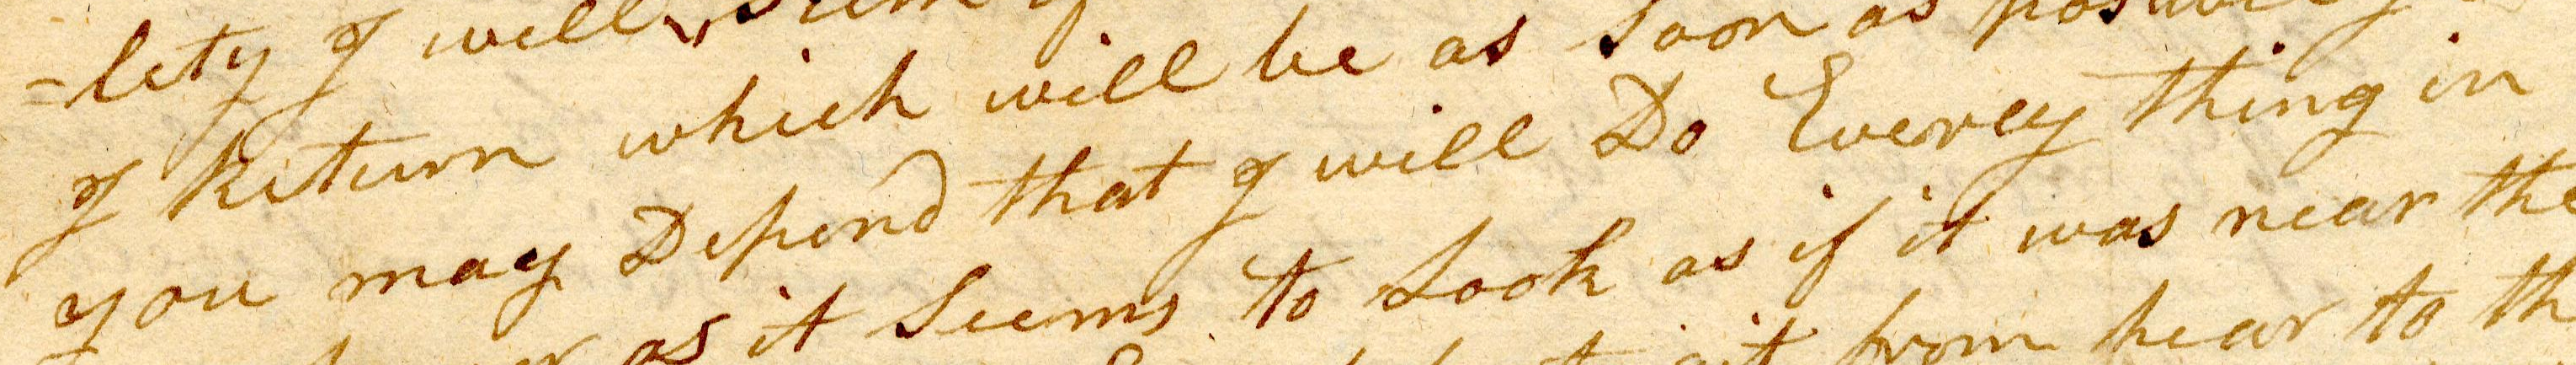you may Depend that I will Do Everey thing in
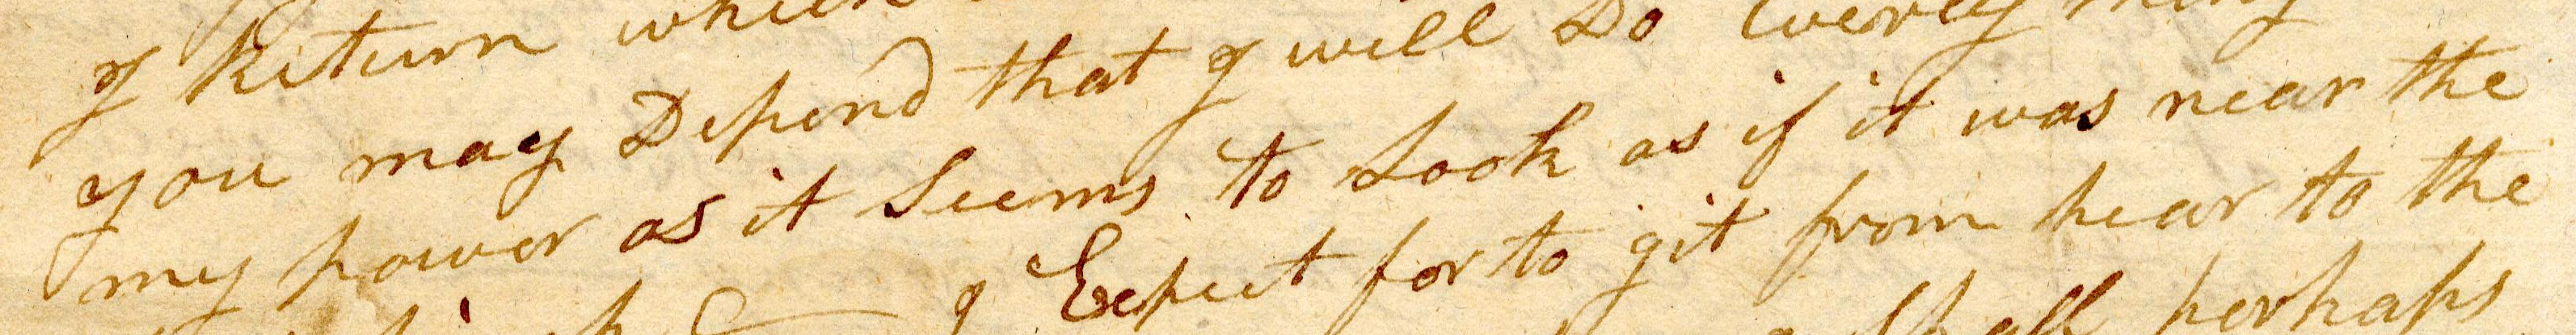my power as it Seems to Look as if it was near the
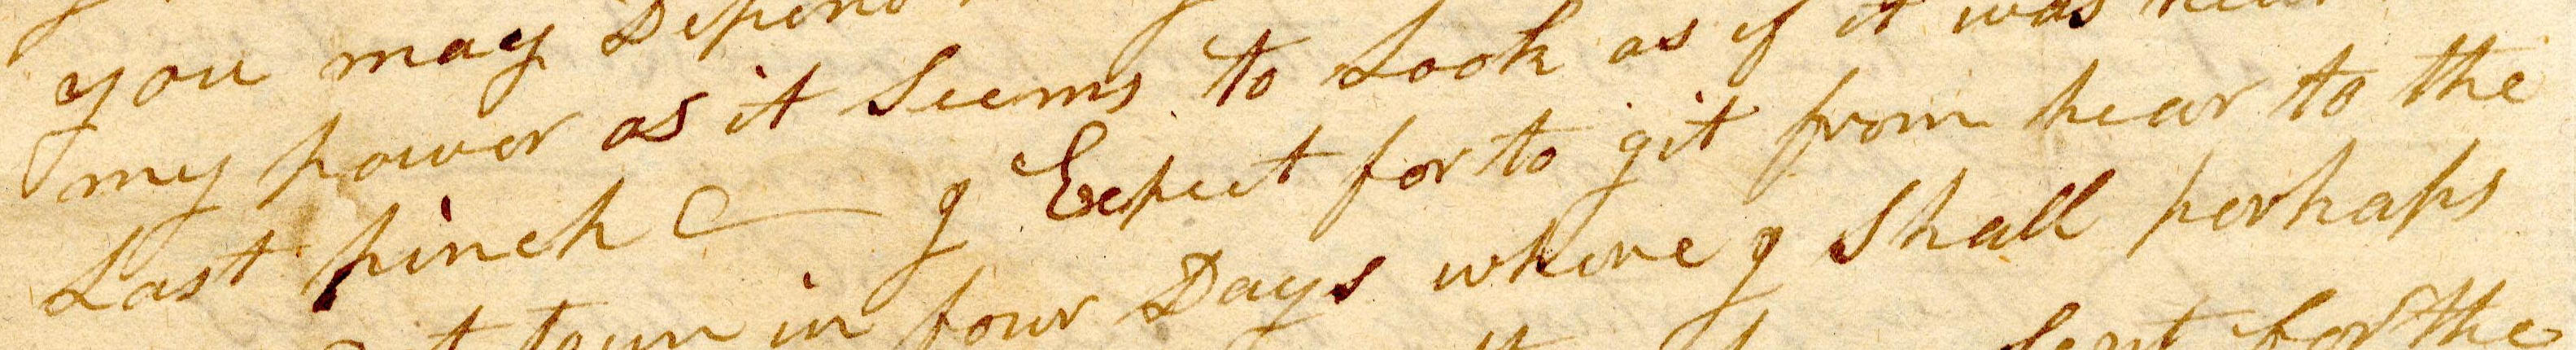Last pinch- l Expect for to git from hear to the
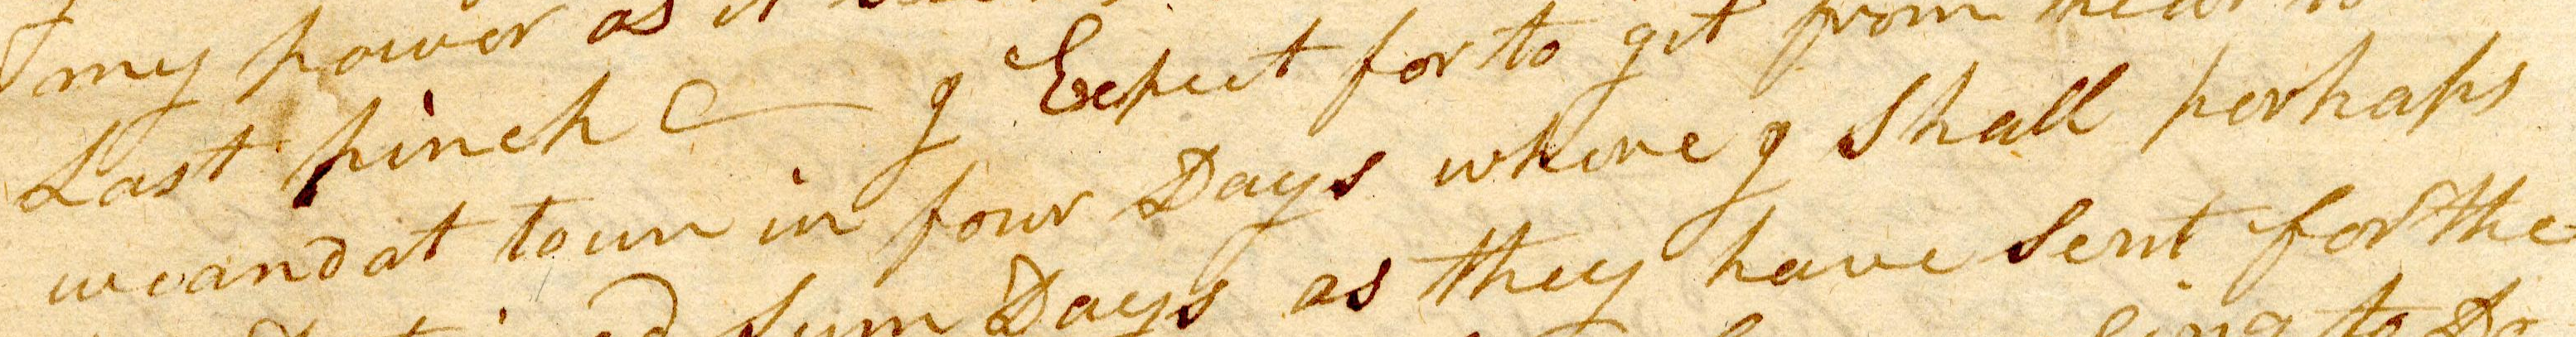weandat toun in four Days where I shall perhaps
